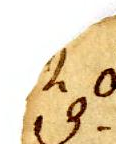2
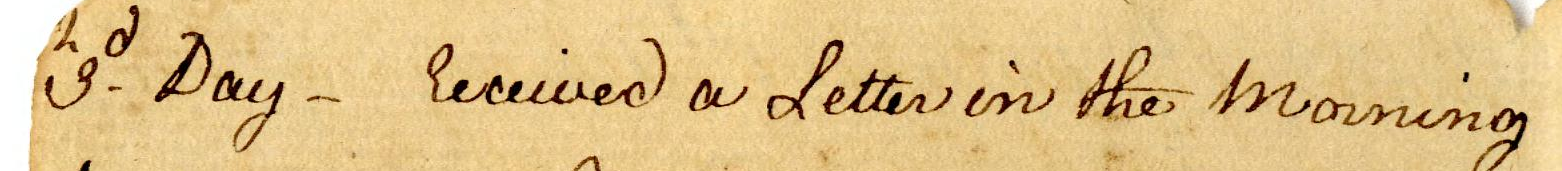3^d. Day- received a Letter the morning
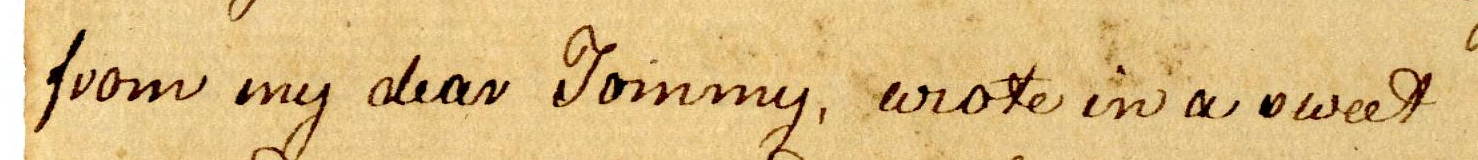from my dear Tommy, wrote in a sweet
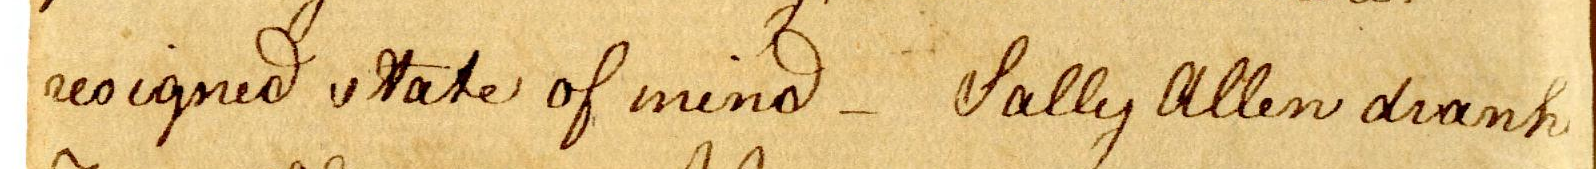resigned state of mind- Sally Allen drank
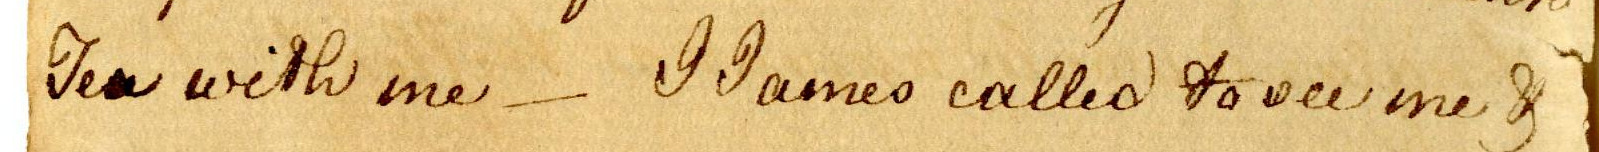Tea with me- I James called to see me &
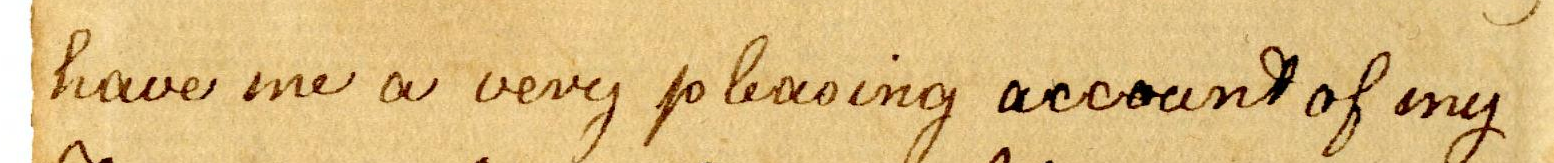have me a very pleasing account of my
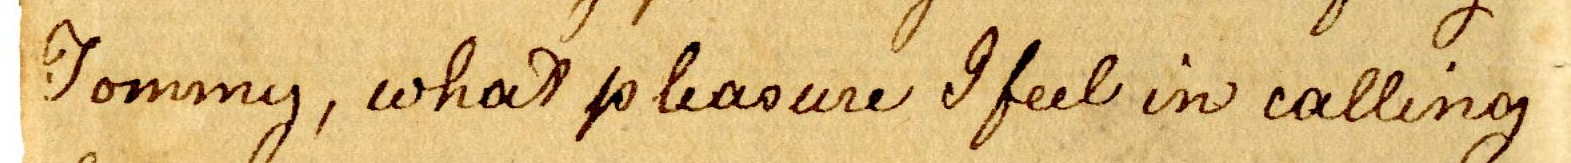Tommy, what pleasure I feel in calling
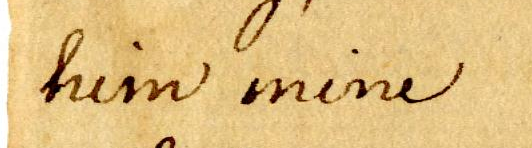him mine
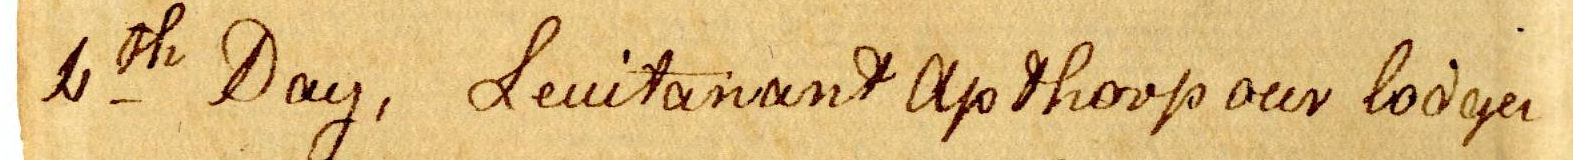4^th Day, Leuitanant Apthorp our lodger
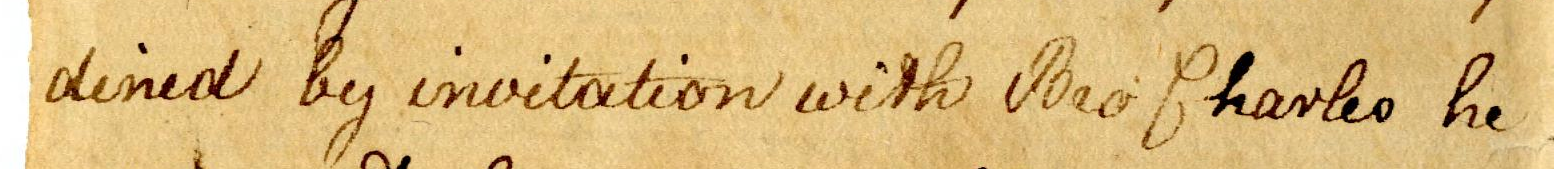dined by invitation with Bro' Charles he
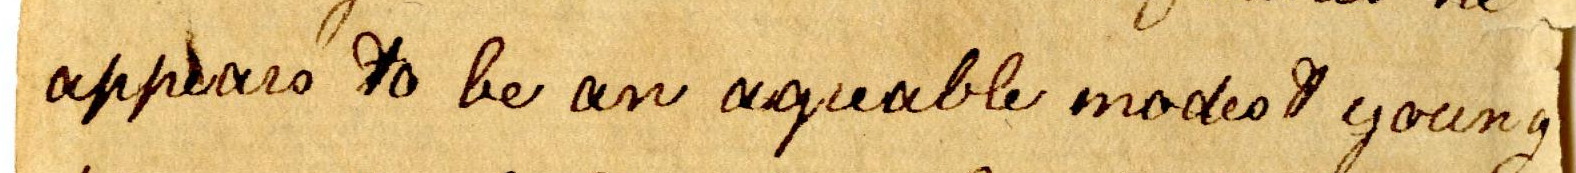appears to be an agreable modest young
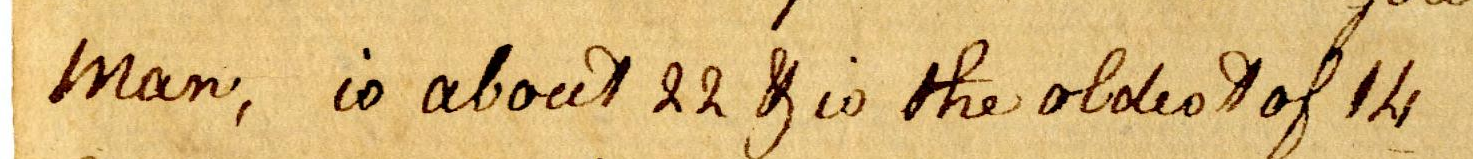Man, is about 22 & is the oldest of 14
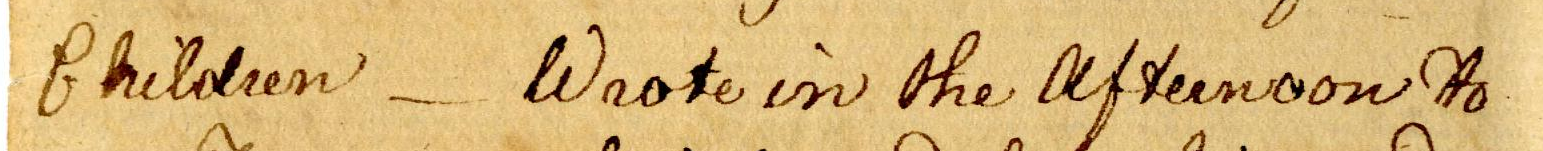Children- Wrote in the Afternoon to
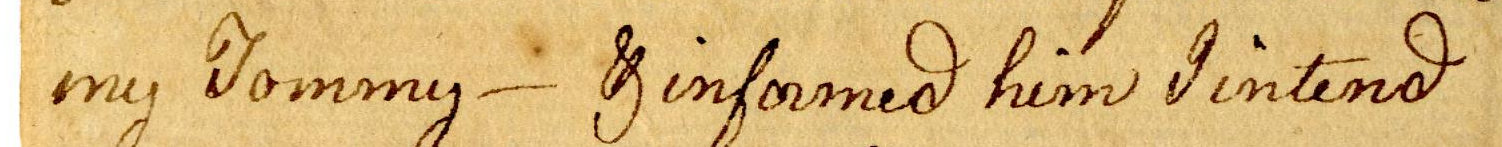my Tommy- & informed him I intend
